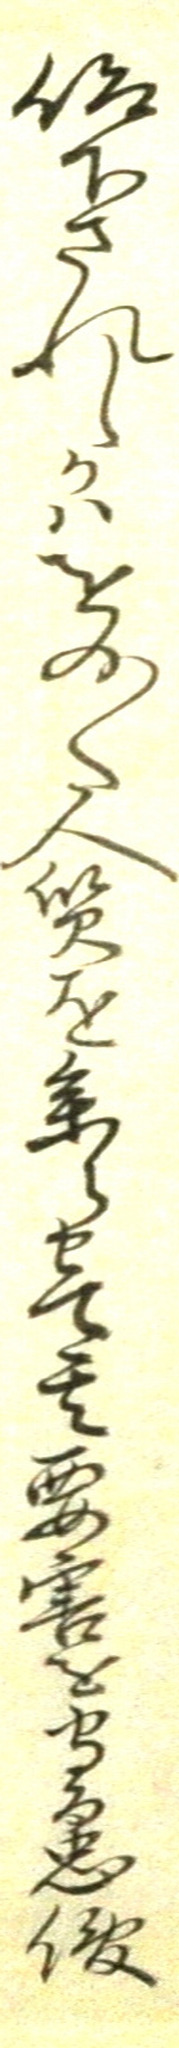仰下されしかはをの〳〵人質を参らせて其要害を守る忠俊
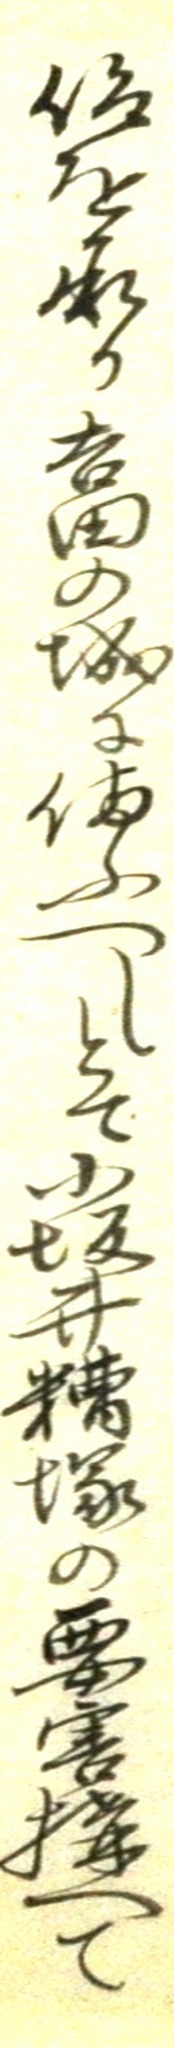仰を承り吉田の城に備ふへしとて小坂井糟塚の要害構へて
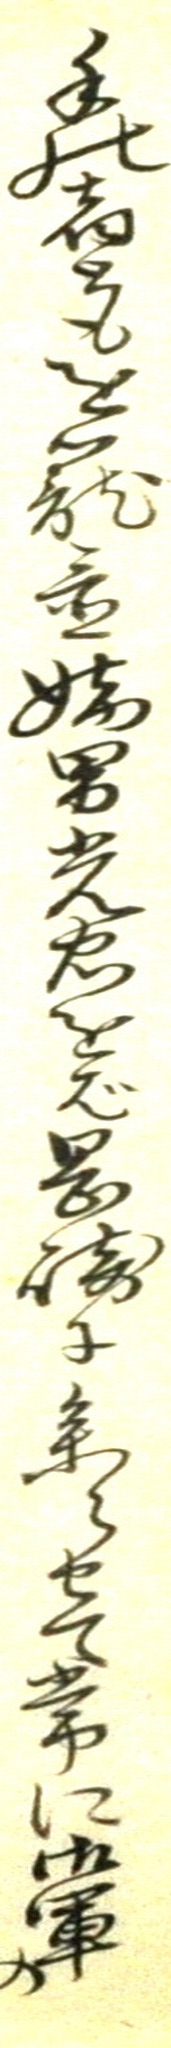手の者ともを籠置嫡男光忠をば岡崎に参らせて常に御軍の
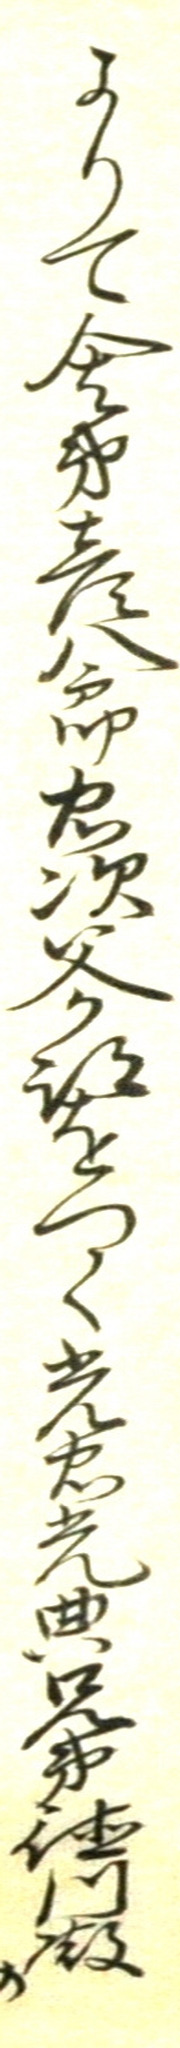よりて舎弟彦八郎忠次父か跡をつく光忠光典兄弟徳川殿の
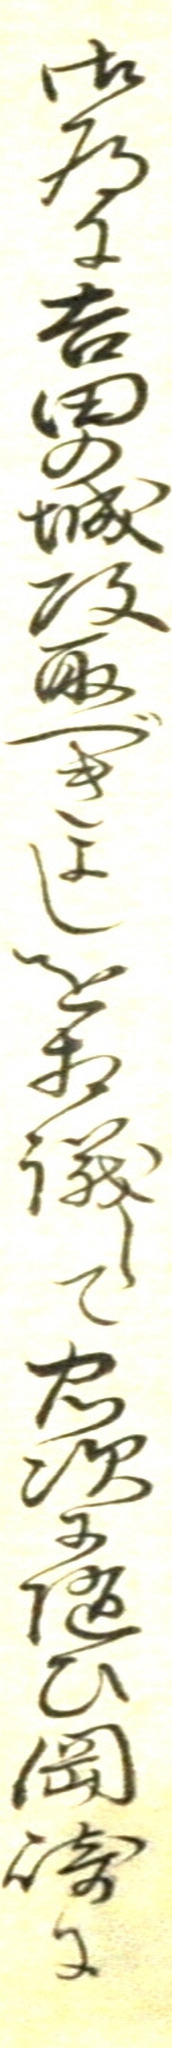御為に吉田の城攻取べきよしを相議して忠次に随ひ岡崎に
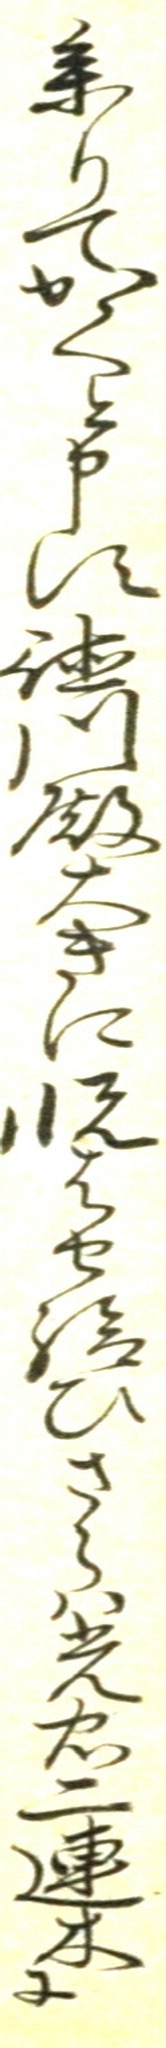参りてかくと申す徳川殿大きに悦はせ給ひさらは光忠二連木に
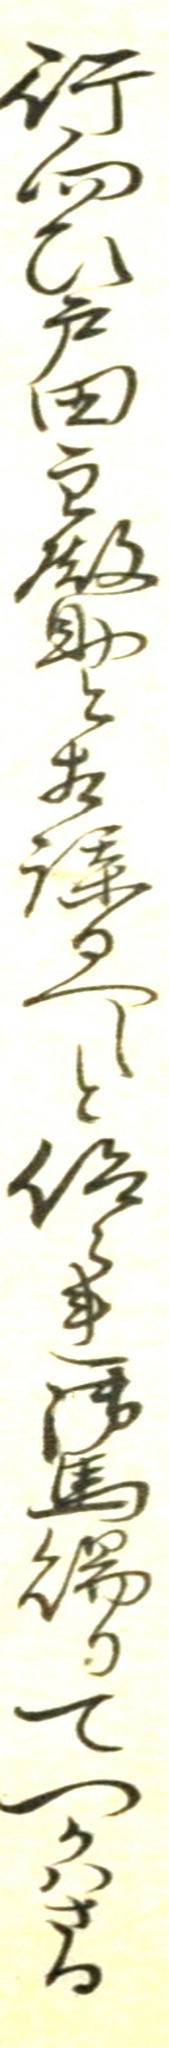行向ひ戸田主殿助と相謀るへしと仰られ御馬賜りてつかはさる
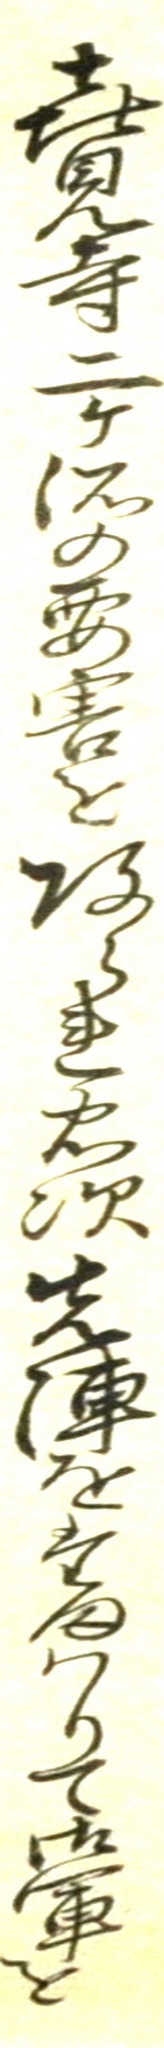喜見寺二ヶ所の要害を攻られ忠次先陣をたまわりて御軍を
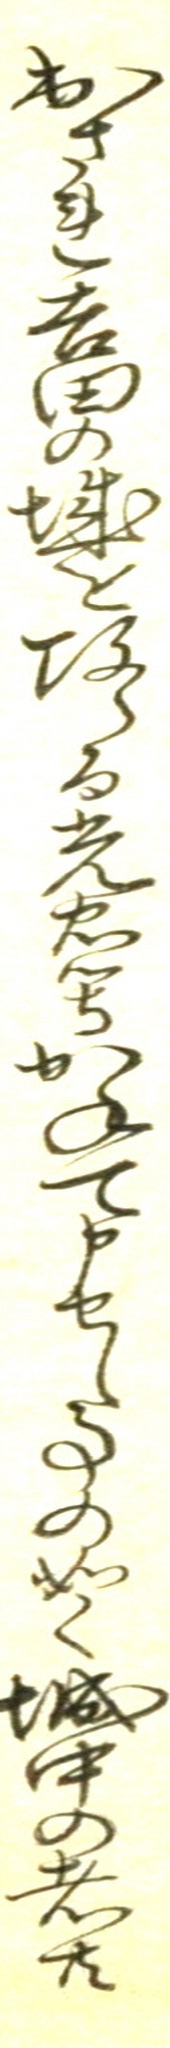出され吉田の城を攻らる光忠等かねて申せし事の如く城中の者共
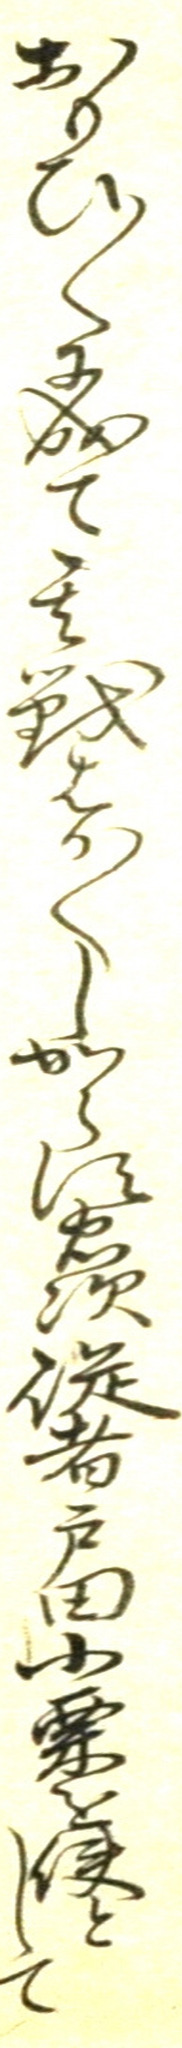おもひ〳〵に成て其戦はか〳〵しからす忠次従者戸田小栗を使として
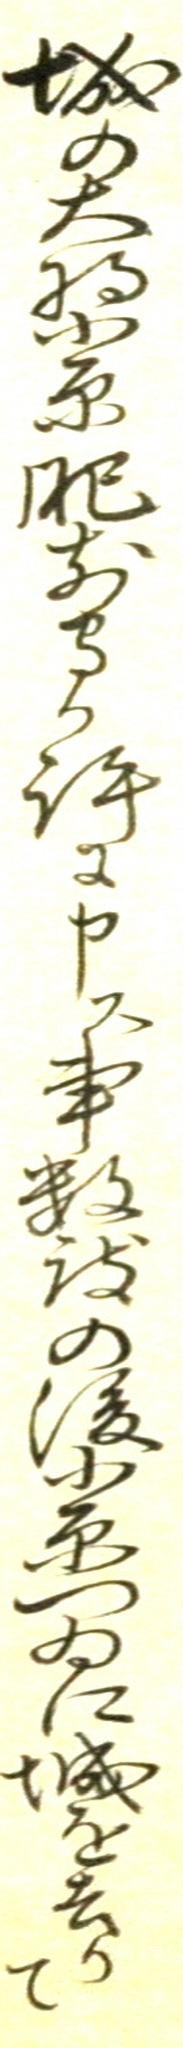しろの大将小原肥前守か許に申ス事数度の後小原つゐに城を去りて
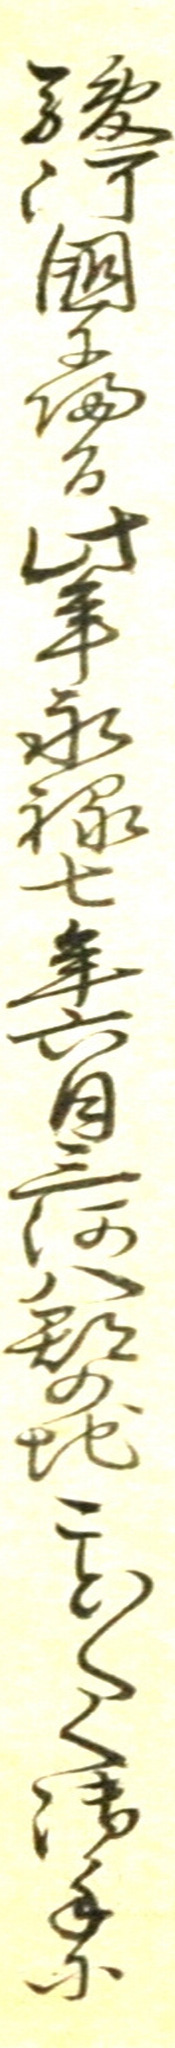駿河国に帰る此年永禄七年六月三河八郡の地こと〳〵く御手に
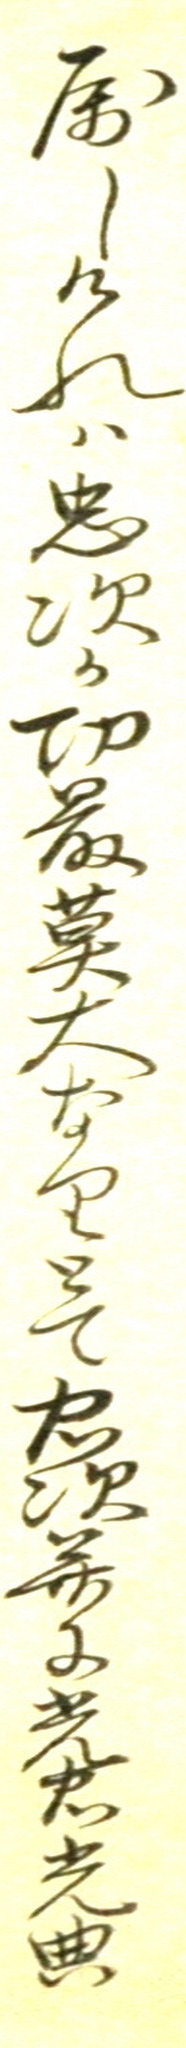属しけれは忠次か功最莫大なりとて忠次幷に光忠光典

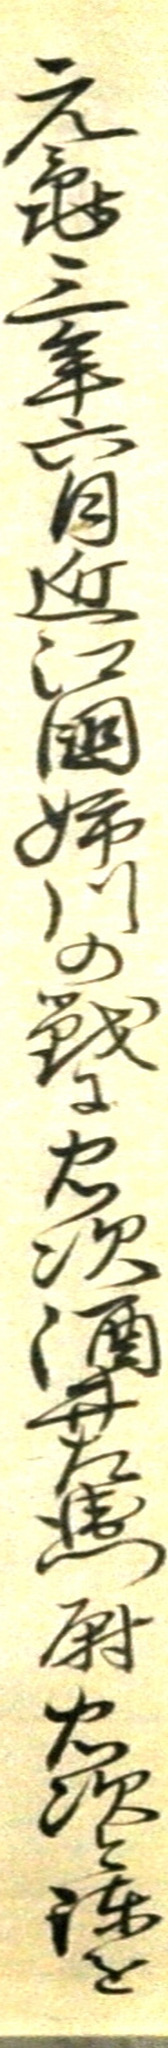元亀三年六月近江国姉川の戦に忠次酒井左衛門尉忠次と陣を
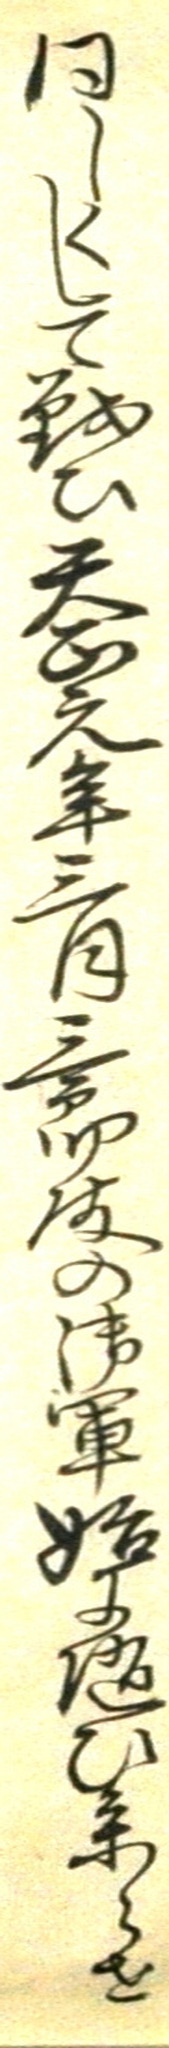同しくして戦ひ天正元年三月三郎殿の御軍始に随ひ参らせ
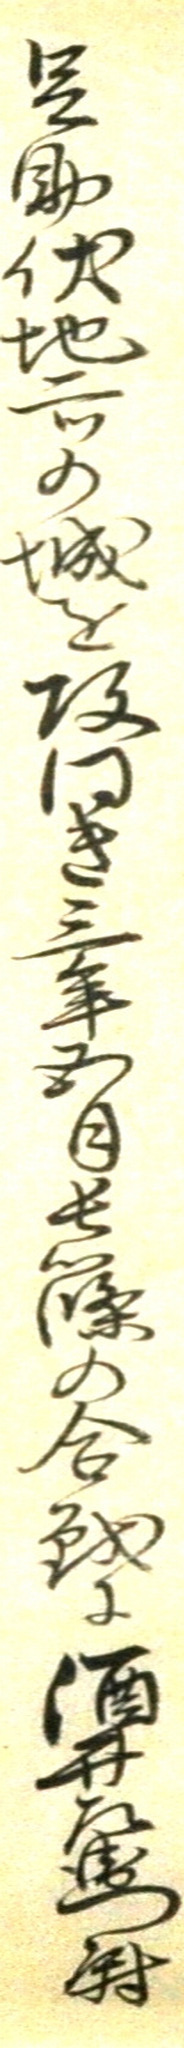足助伏地二ツの城を攻同き三年五月長篠の合戦に酒井左衛門尉
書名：藩翰譜（四・上）
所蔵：伊那市立高遠町図書館・合同会社AMANE
